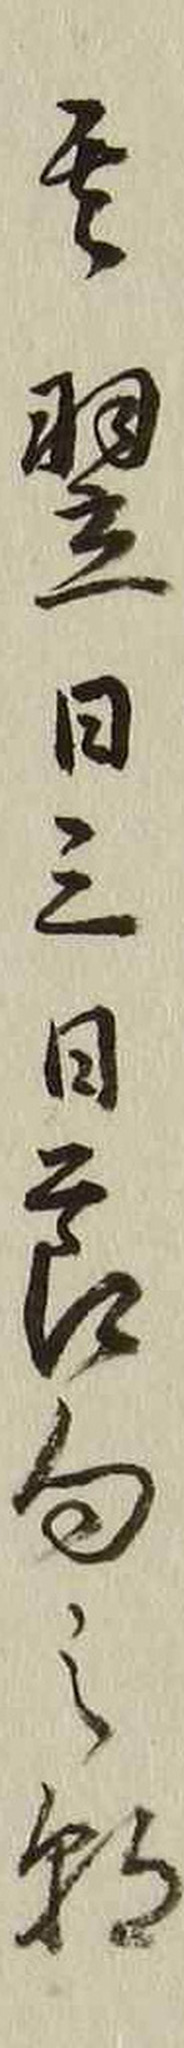其翌日三日節句之朝
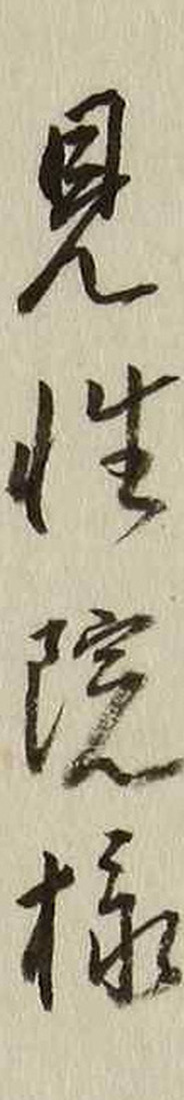見性院様
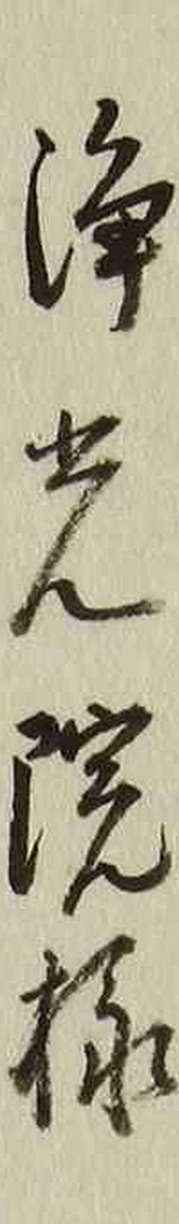浄光院様
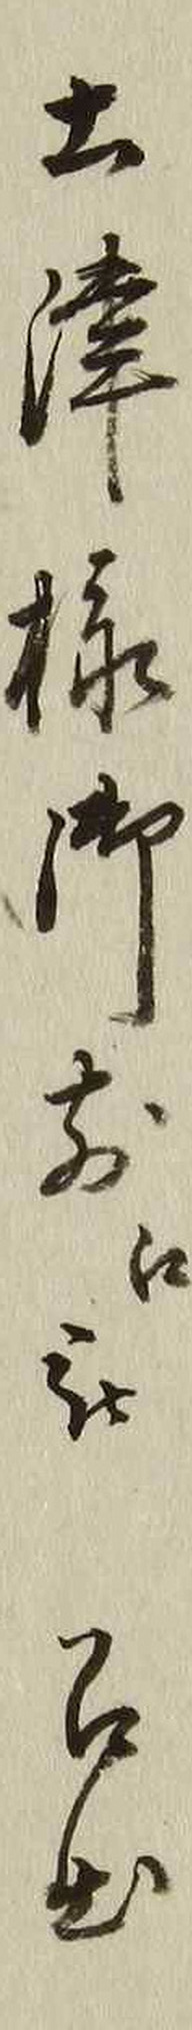土津様御前江被召出
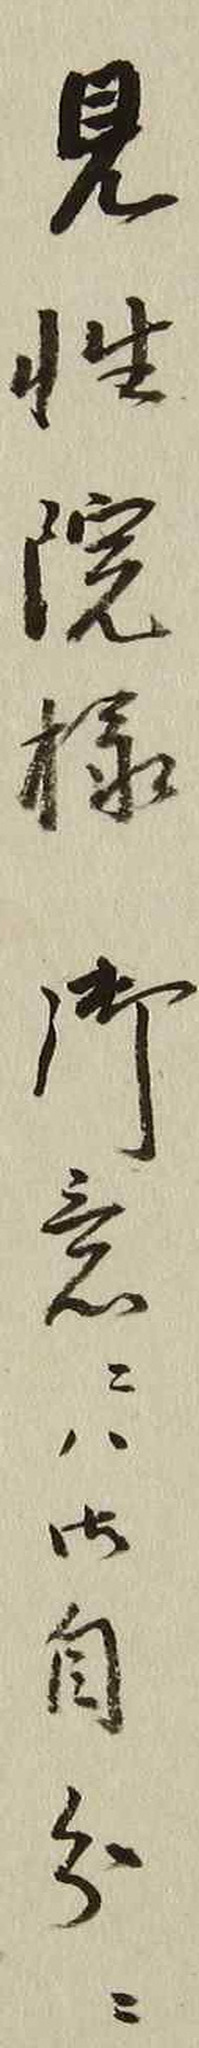見性院様御意ニハ御自分ニ
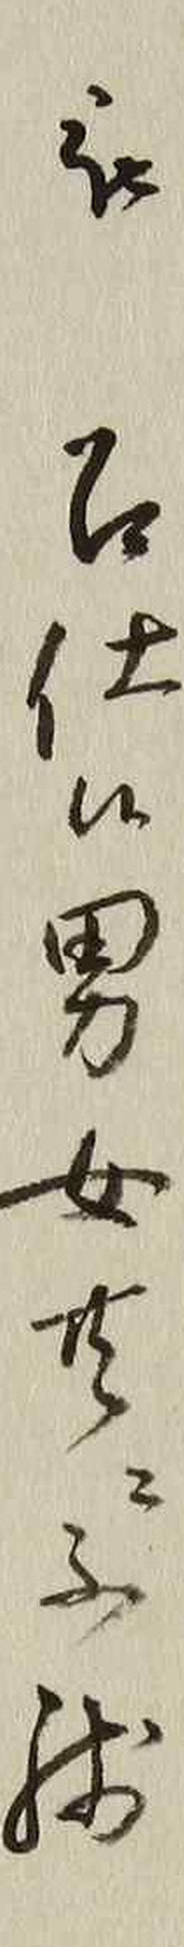被召仕候男女共ニ不残
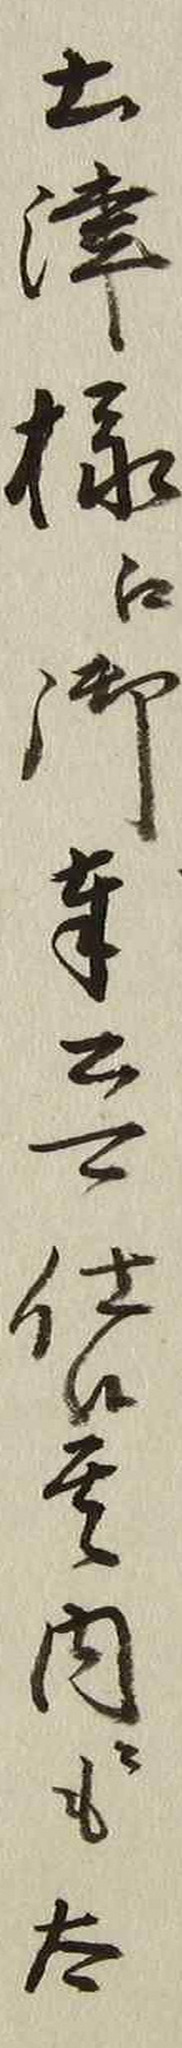土津様江御奉公可仕候其内ニも太
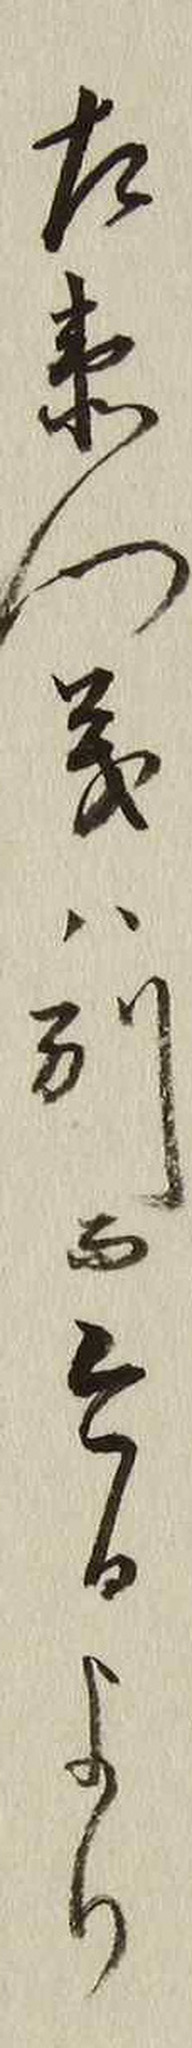左衛門義ハ別而今日より
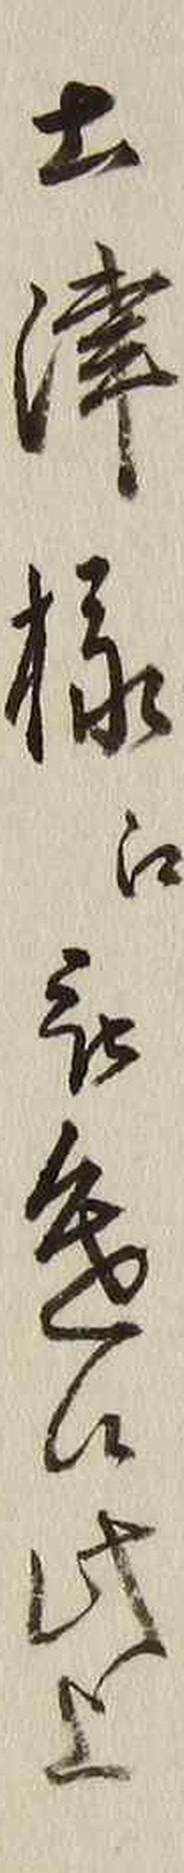土津様江被遣候此上
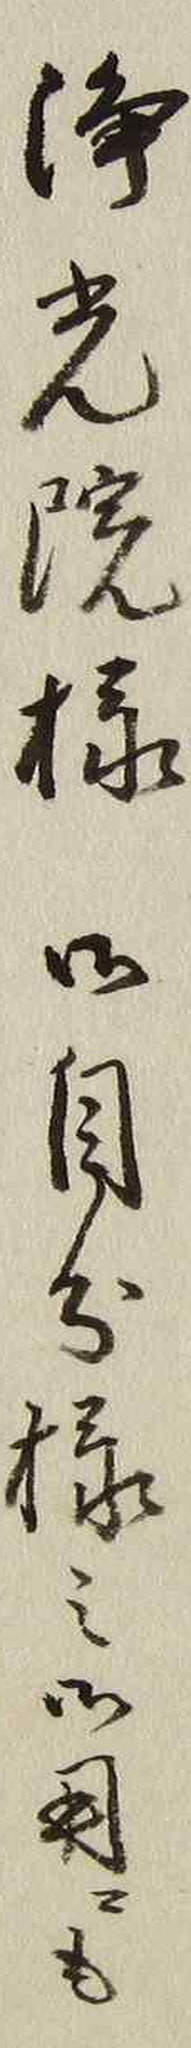浄光院様御目分様之御用ニも
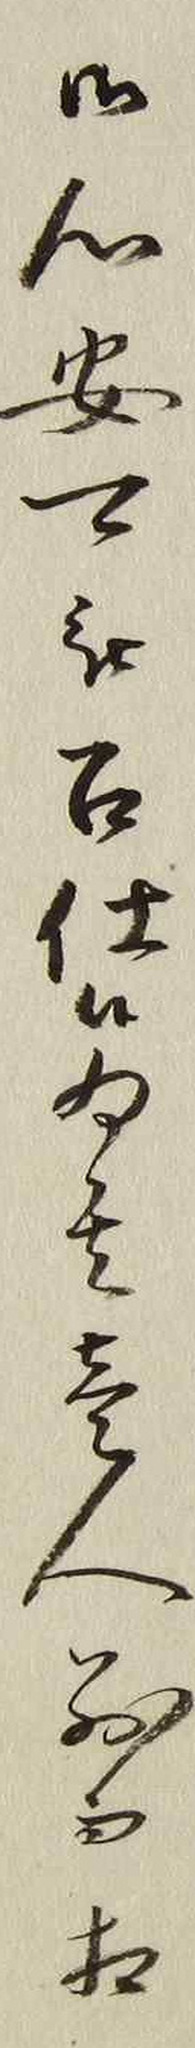御心安可被召仕候為其壱人別而相
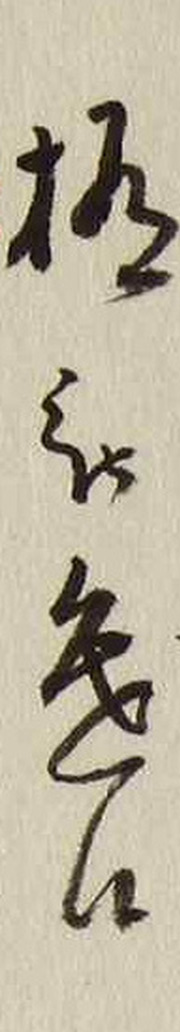極被遣候
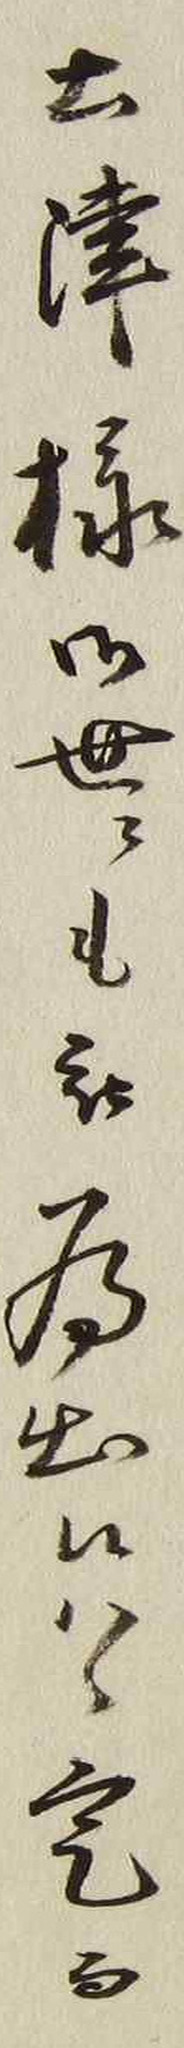土津様御世ニも被為出候ハヽ定而
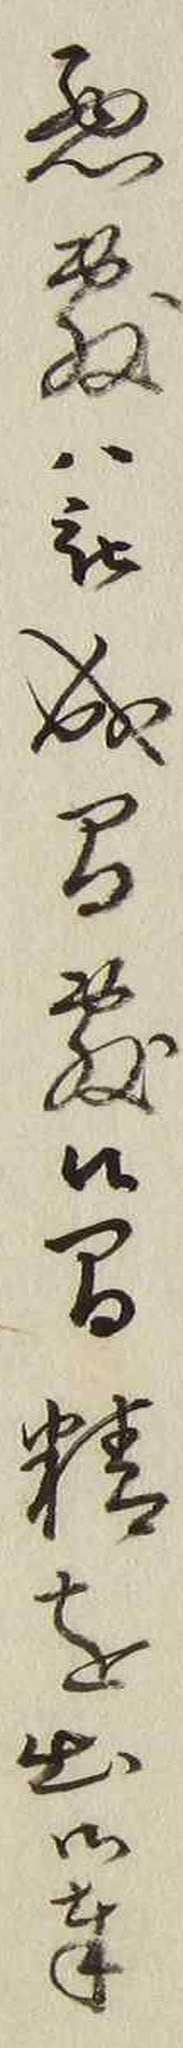悪敷ハ被成間敷候間精を出御奉
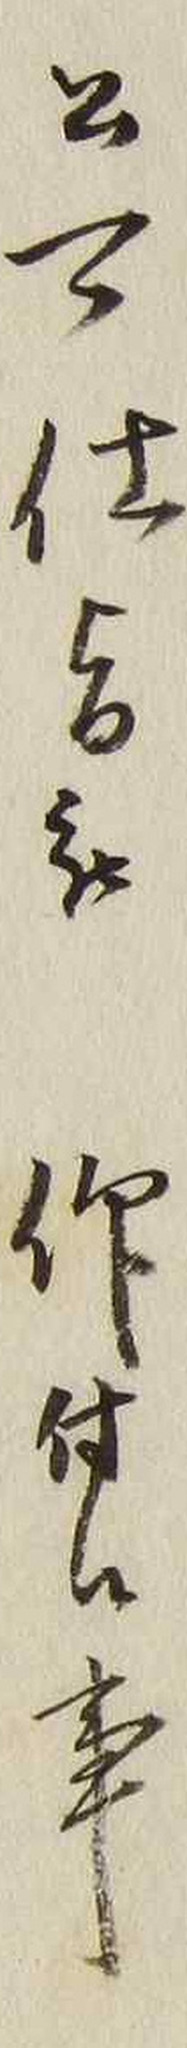公可仕旨被仰付候事

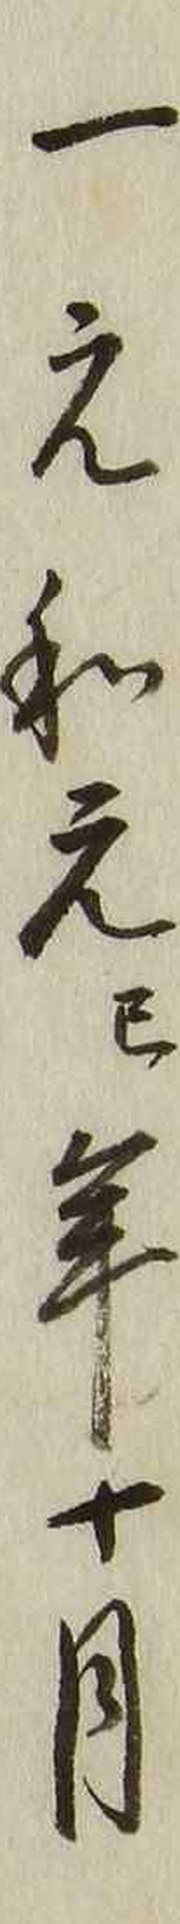一元和元巳年十月
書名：諸士系譜　巻之149　そ之部2
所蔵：会津若松市立会津図書館
